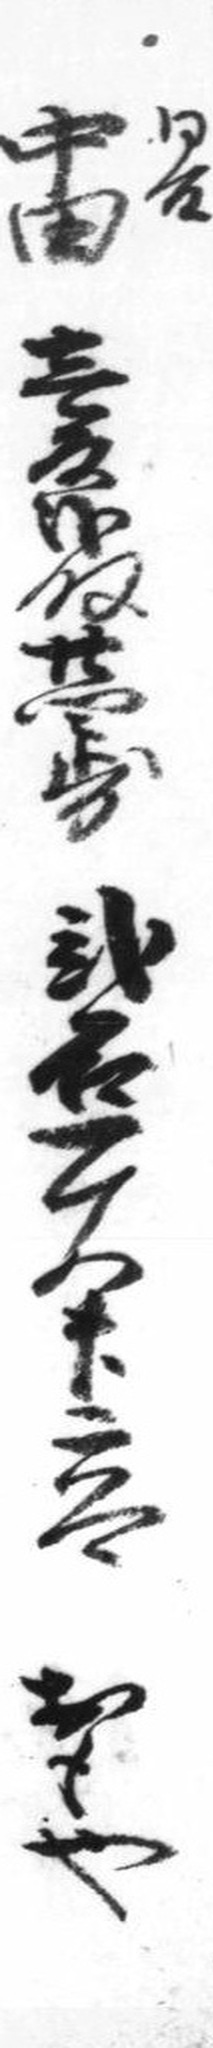中田壱反弐畝廿四歩弐石一斗八升二合出〆や
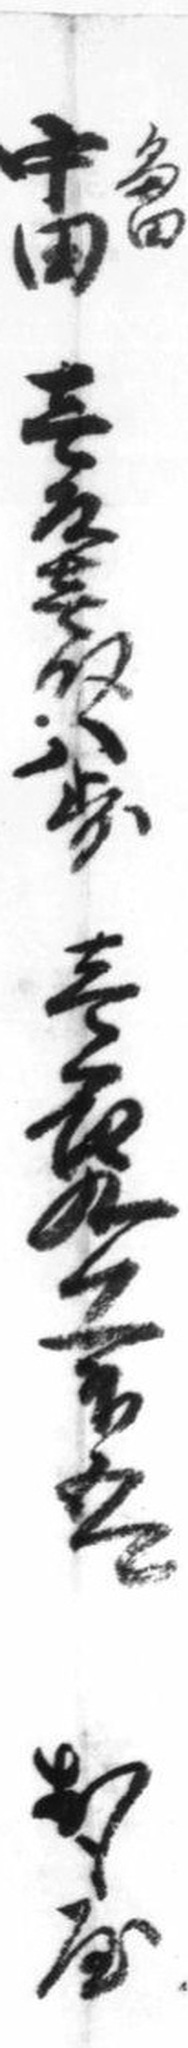中田壱反壱畝八歩壱石九斗一升五合出〆屋
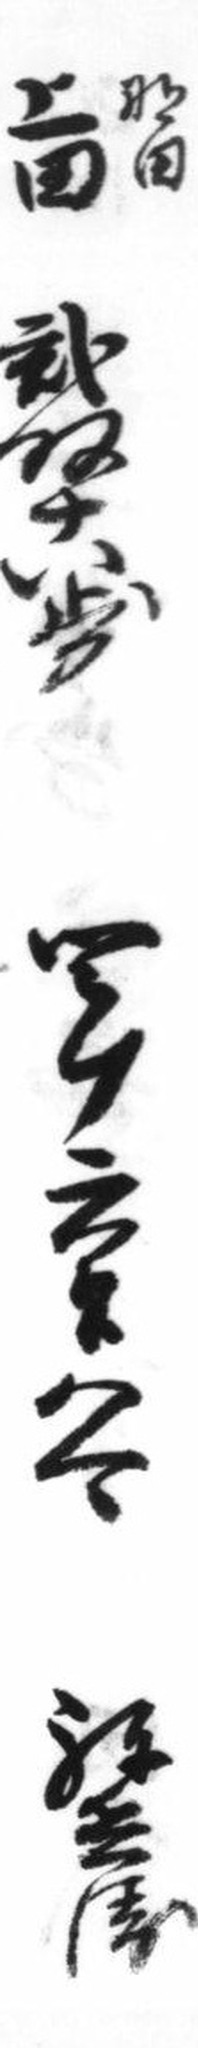上田弐畝十八歩四斗六升八合孫兵衛
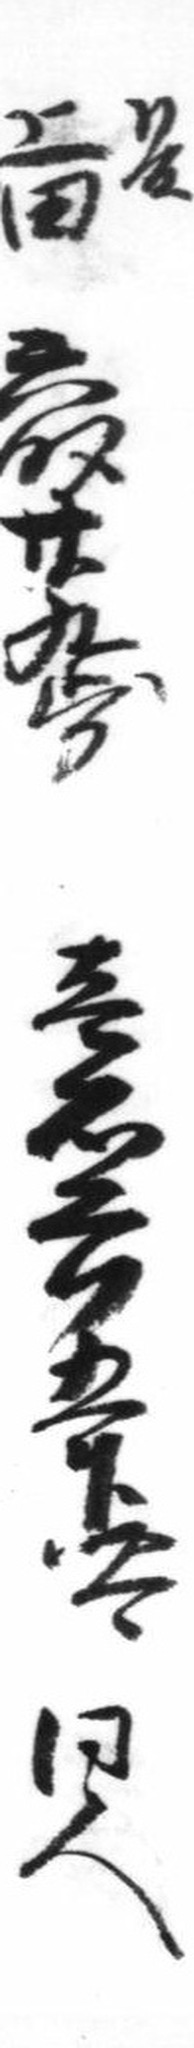上田六畝廿九歩壱石二斗五升四合同人
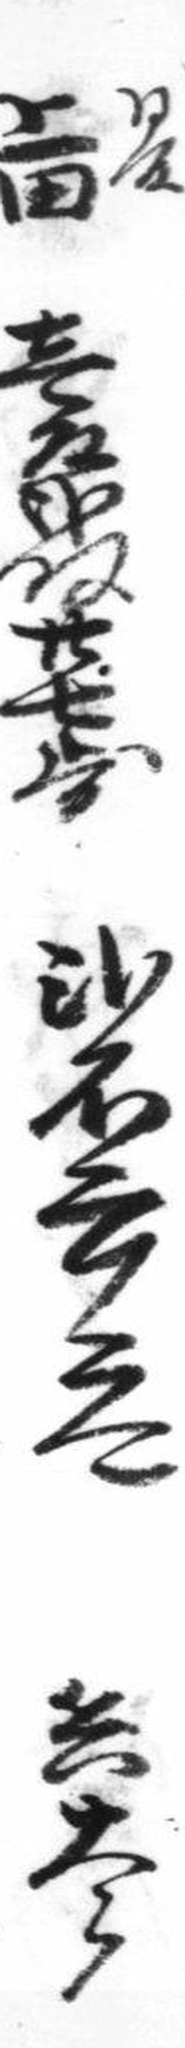上田壱反弐畝廿七歩弐石二斗二合兵太郎
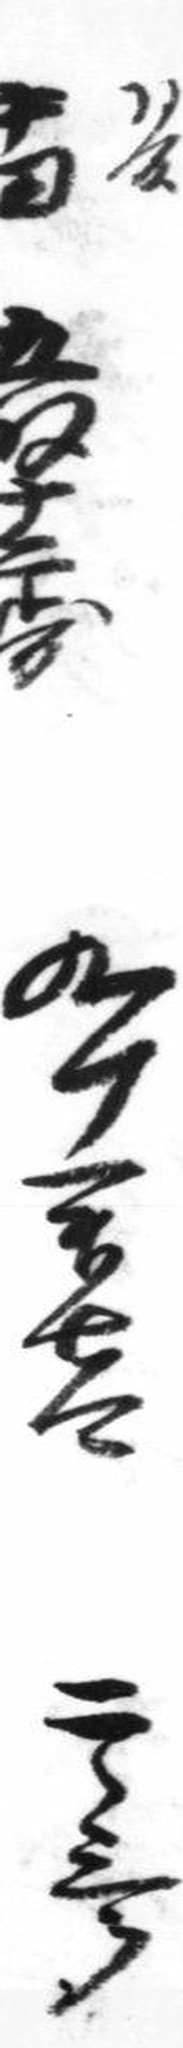中田五畝十二歩九斗一升七合二郎三郎
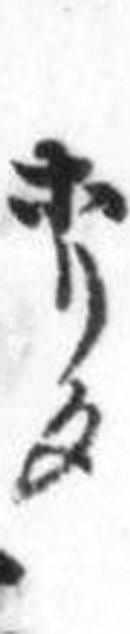ホリタ
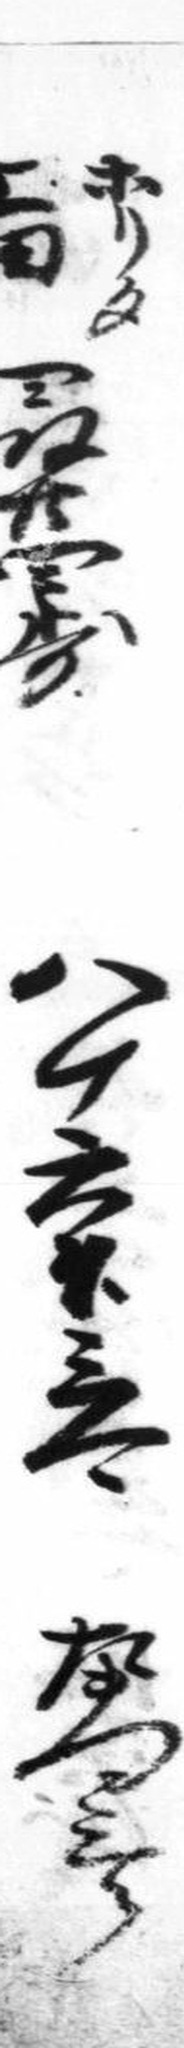上田四畝廿四歩八斗六升三合左衛門三郎
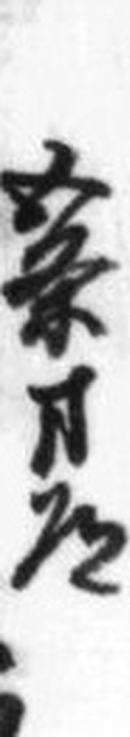五条方道

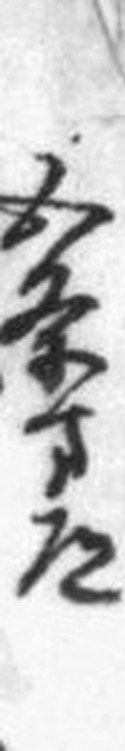五条方道
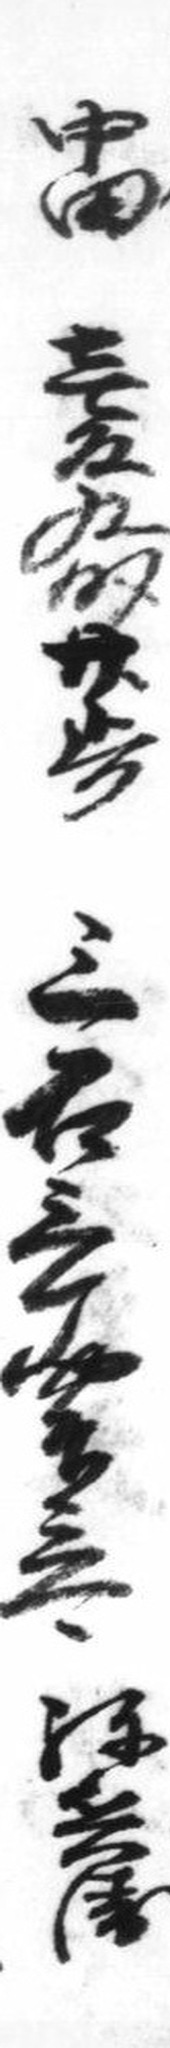中田壱反九畝廿歩三石三斗四升三合孫兵衛
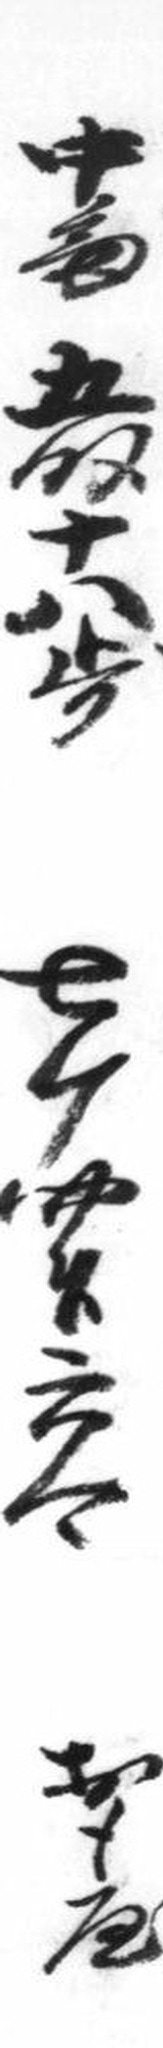中畠五畝十八歩七斗四升六合出〆屋
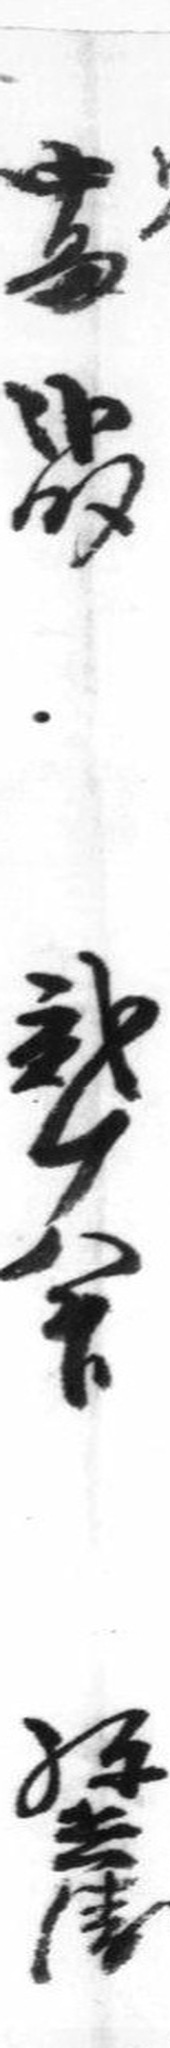中畠弐畝弐斗八升孫兵衛
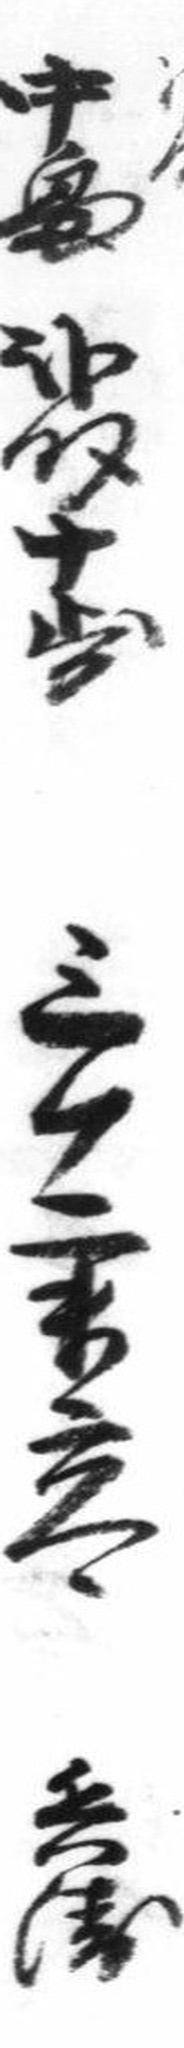中畠弐畝十歩三斗二升六合兵兵衛
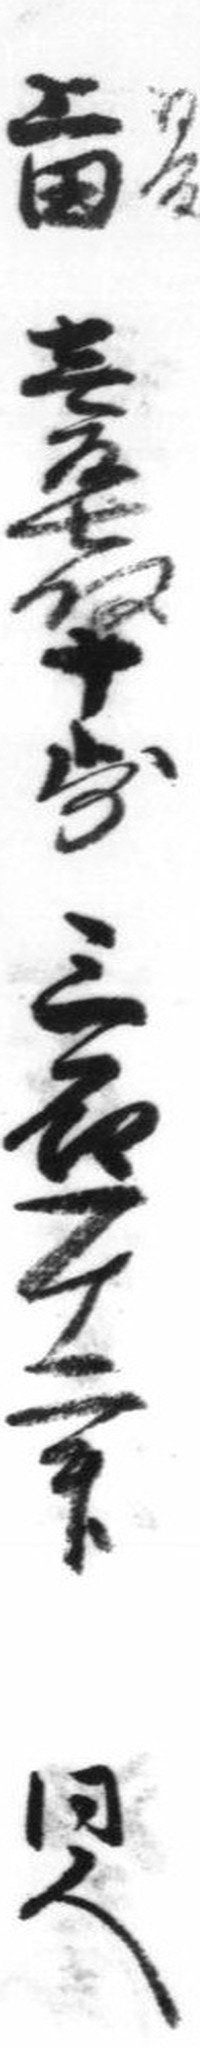上田壱反七畝十歩三石一斗二升同人
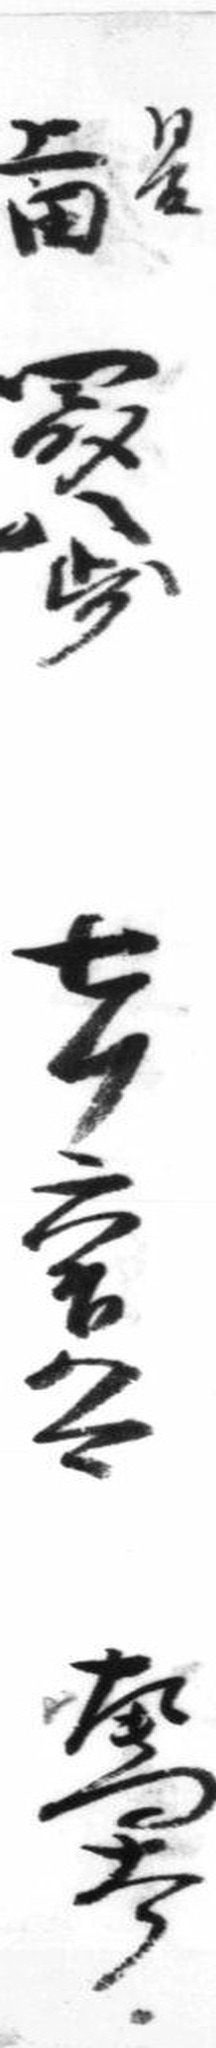上田四畝八歩七斗六升八合左衛門太郎
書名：越前国大野郡今井村御検地帳
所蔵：福井県文書館 Fukui Prefectural Archives
